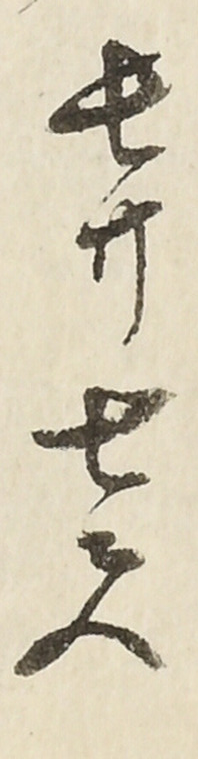長サ五尺
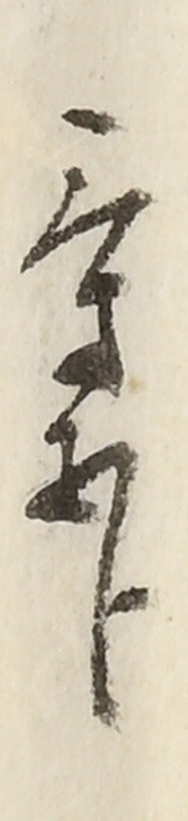三寸五分
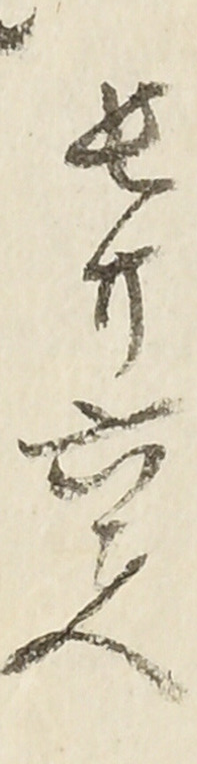長サ五尺
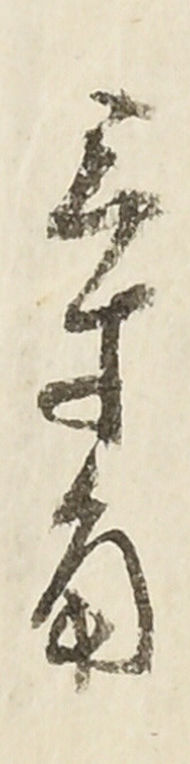三寸角
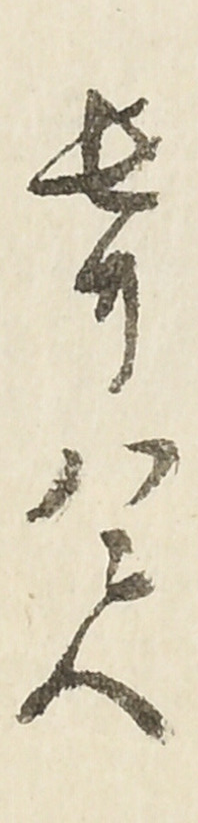長サ五尺
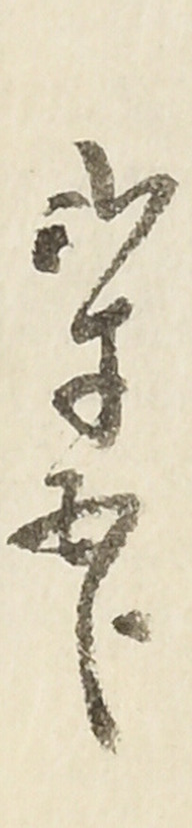弐寸五分
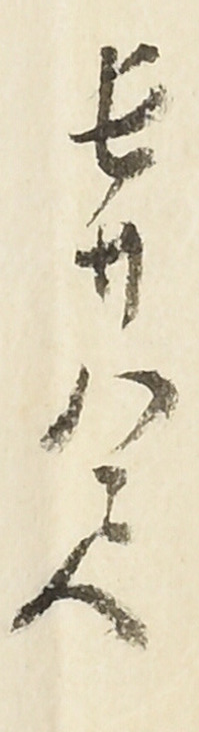長サ五尺
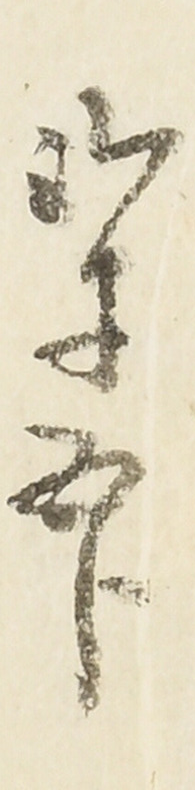弐寸五分
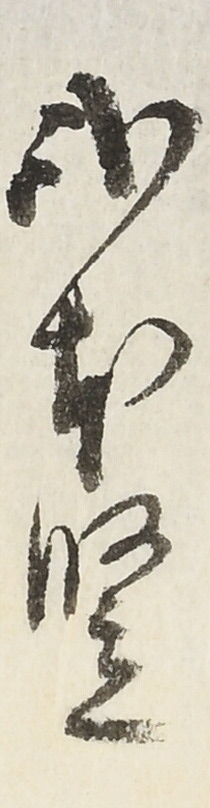弐本竪
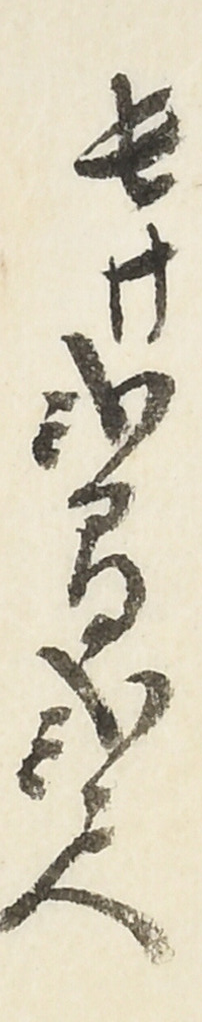長サ弐間弐尺
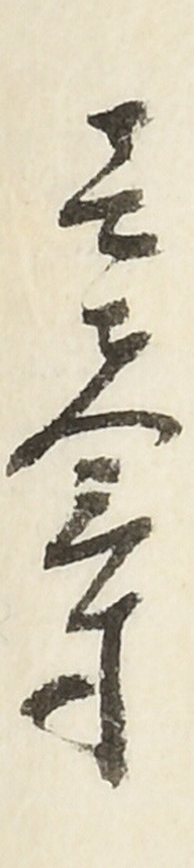壱尺三寸
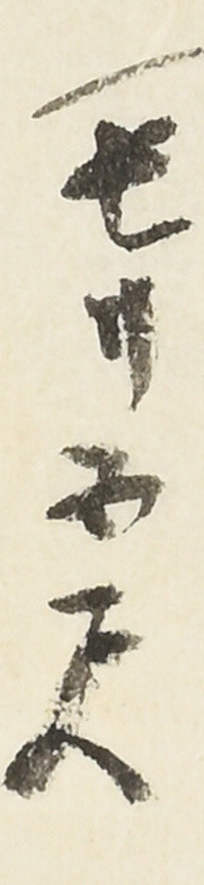長サ五尺
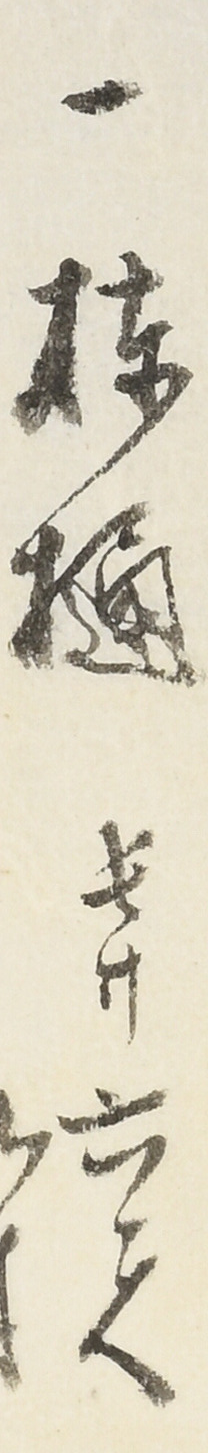一棟樋長サ六尺

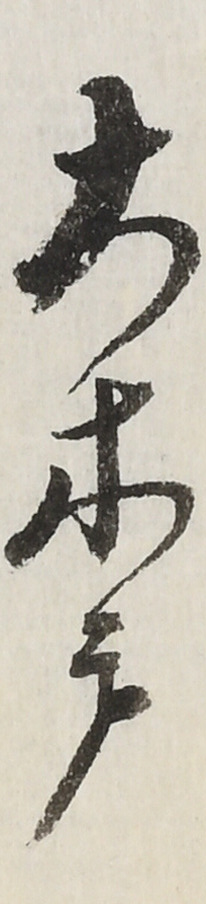大木戸
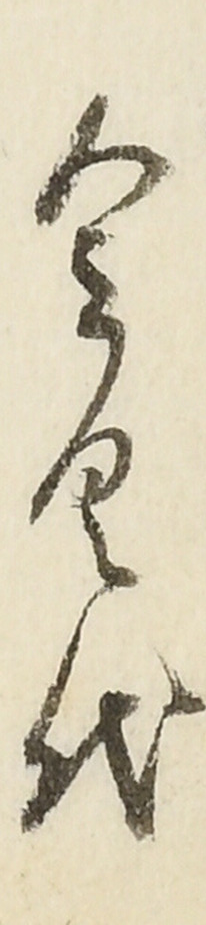金具代
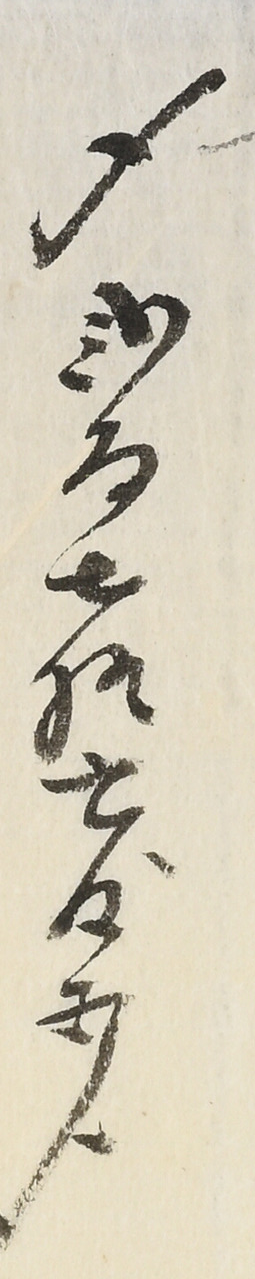〆弐百七拾六匁五分
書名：町方木戸御普請諸事附（一括）
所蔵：伊那市立高遠町図書館・合同会社AMANE
